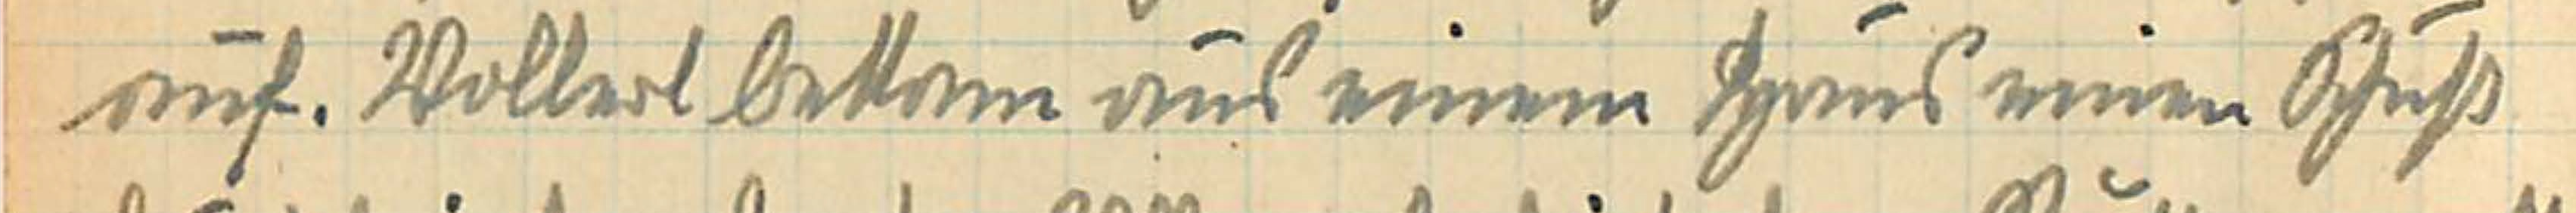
auf. Vollert bekam aus einem Haus einen Schuß
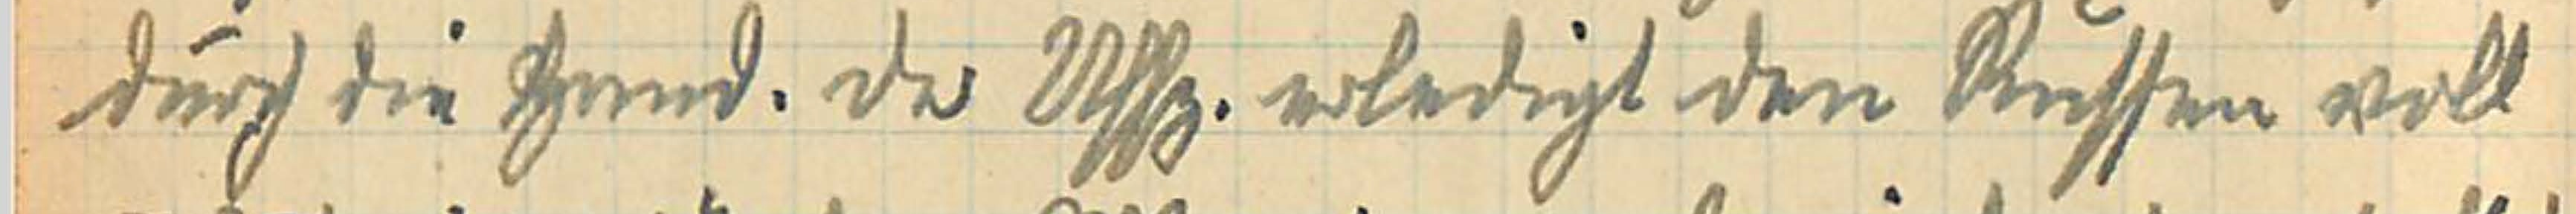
durch die Hand. Der Uffz. erledigt den Russen voll
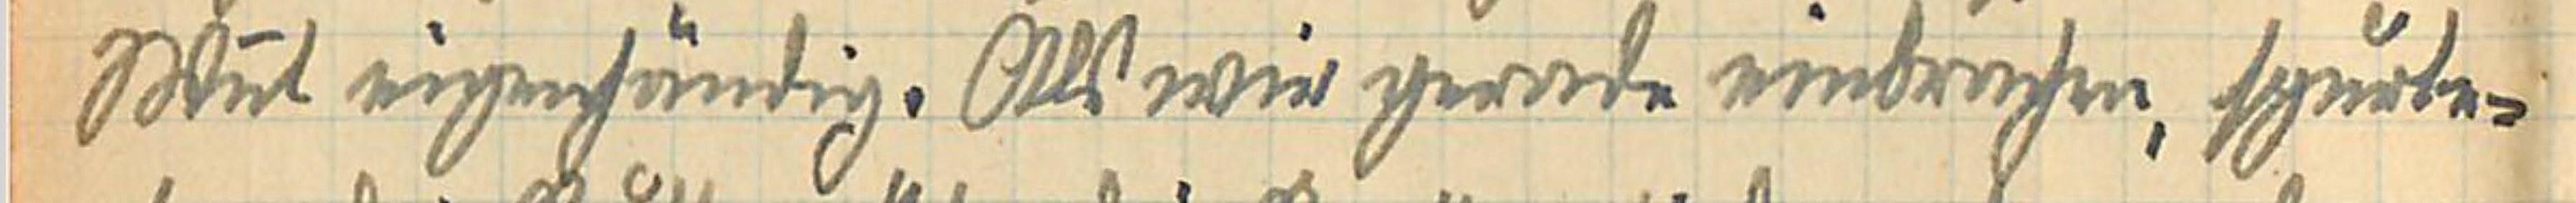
Wut eigenhändig. Als wir gerade einbrachen, spurte-
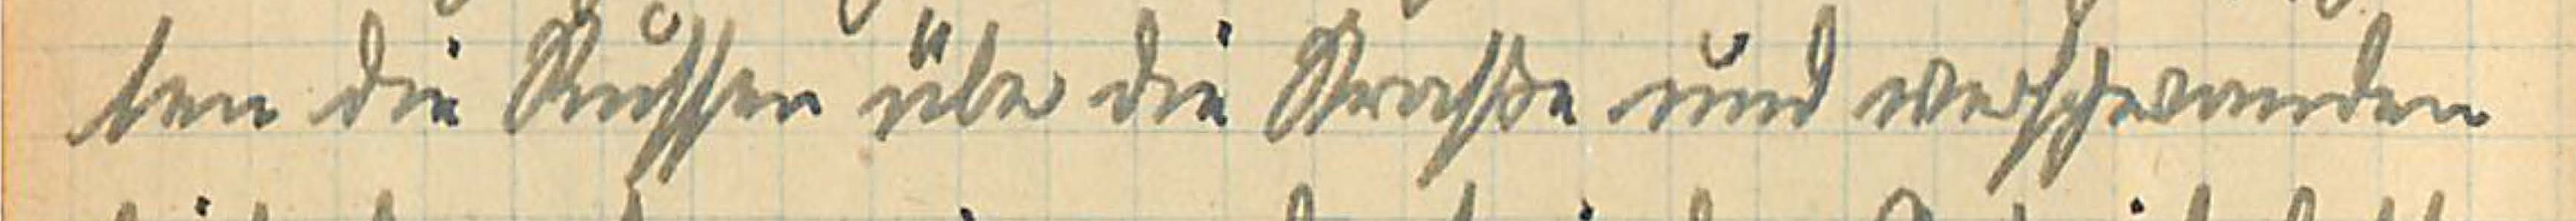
ten die Russen über die Straße und verschwanden
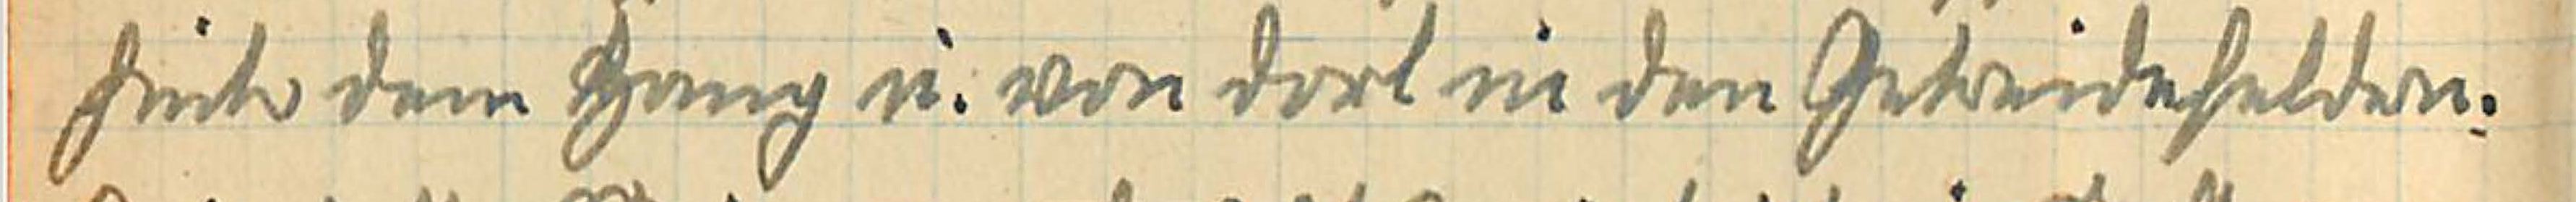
hinter dem Hang u. von dort in den Getreidefeldern.
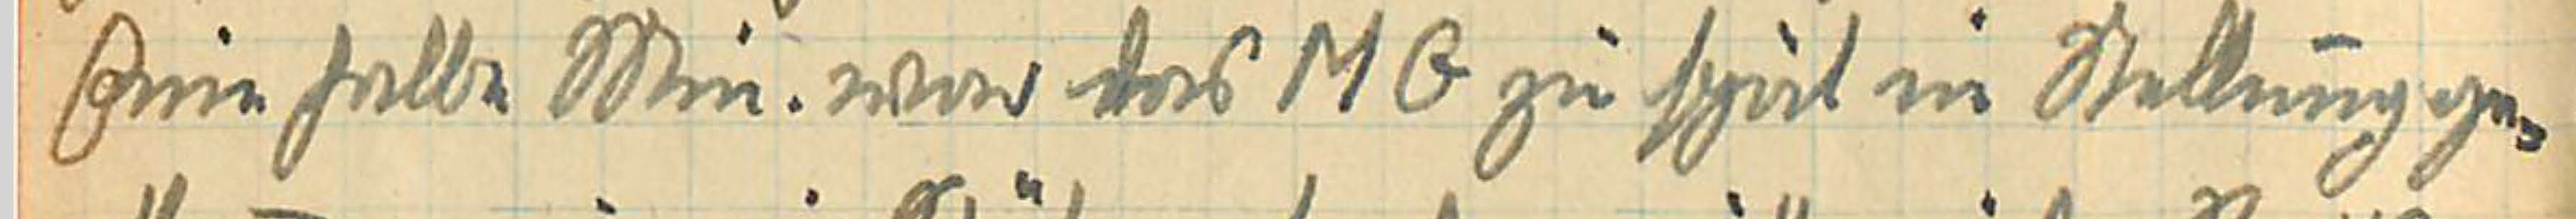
Eine halbe Min. war das MG zu spät in Stellung ge-
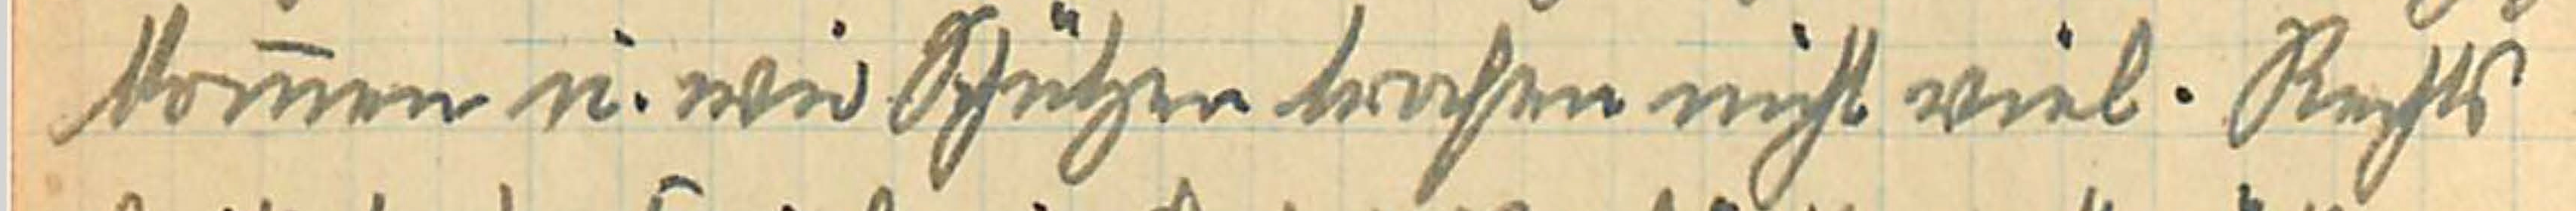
kommen u. wir Schützen trafen nicht viel. Rechts
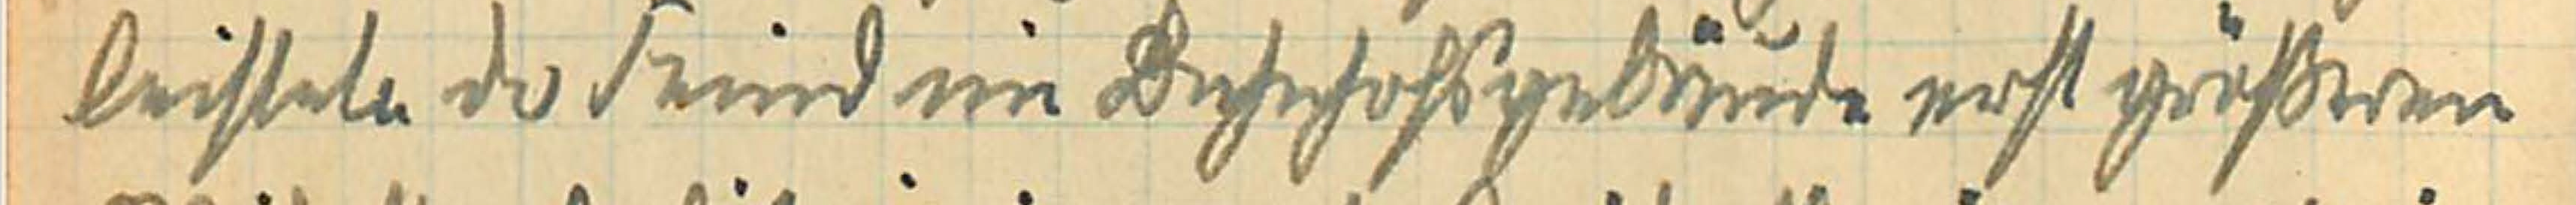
leistete der Feind im Bahnhofsgebäude erst größeren
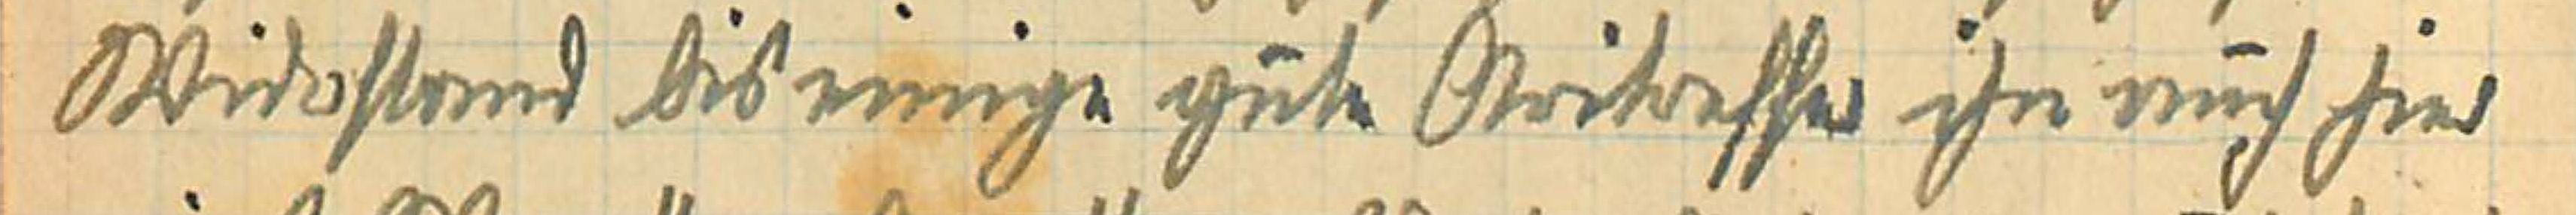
Widerstand bis einige gute Aritreffer ihn auch hier
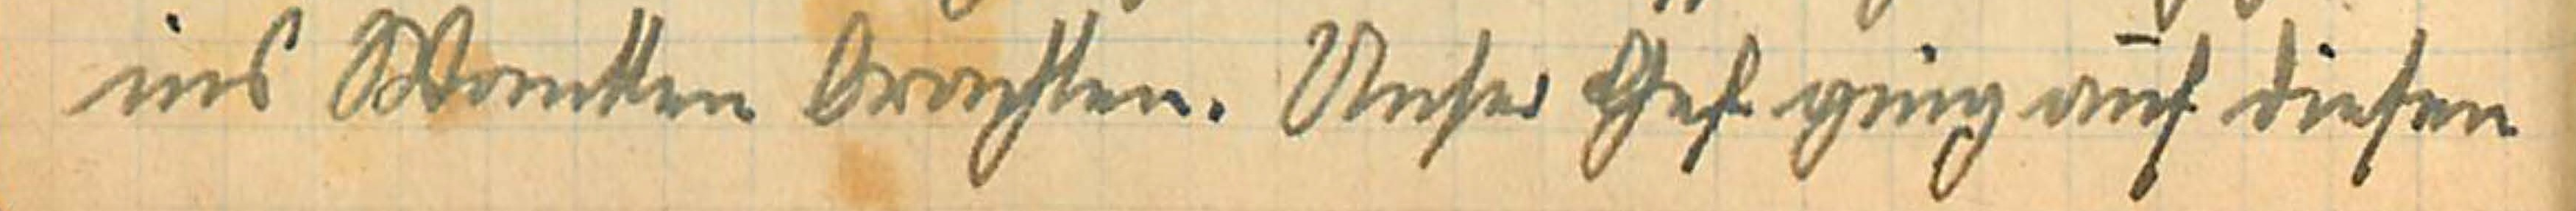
Ins Wanken brachten. Unser Chef ging auf diesen
